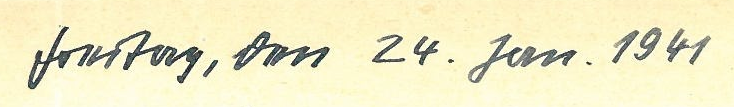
Freitag, den 24. Jan.1941
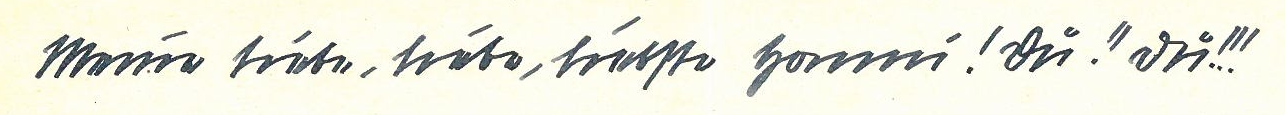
Meine liebe, liebe, liebste ! Du!! Du!!!
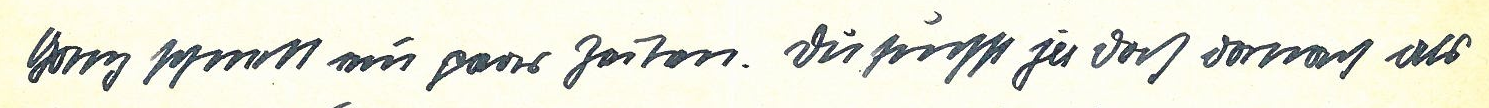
Ganz schnell ein paar Zeilen. Du suchst ja doch danach als
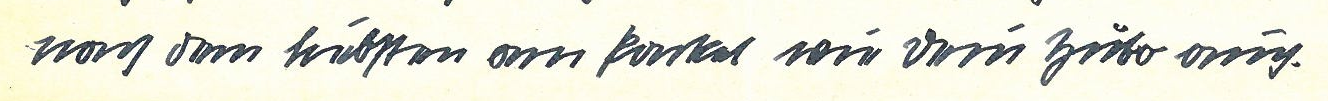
nach dem liebsten am Packel wie Dein Hubo auch.
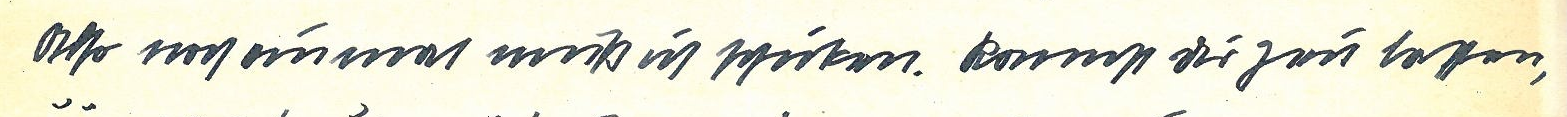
Also noch einmal muß ich schicken. Kannst Dir Zeit lassen,
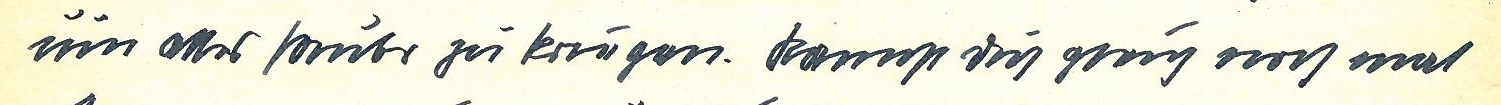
um alles sauber zu kriegen. Kannst Dich gleich noch mal
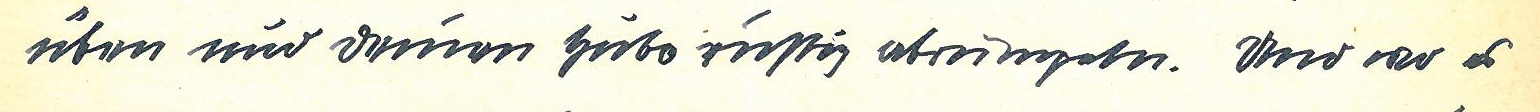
üben und Deinen Hubo richtig abrumpeln. Und wo es
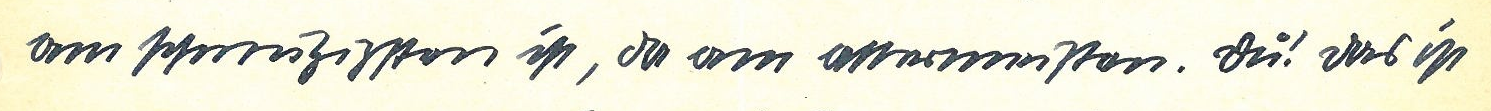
am schmutzigsten ist, da am allermeisten. Du! Das ist
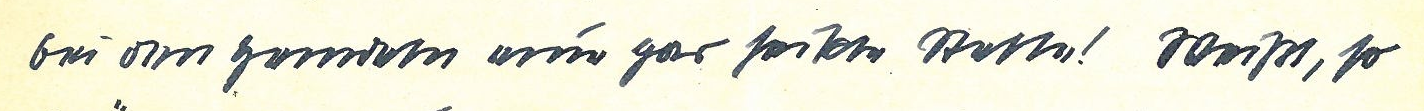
bei den Hemden eine gar heikle Stelle! Weißt , so
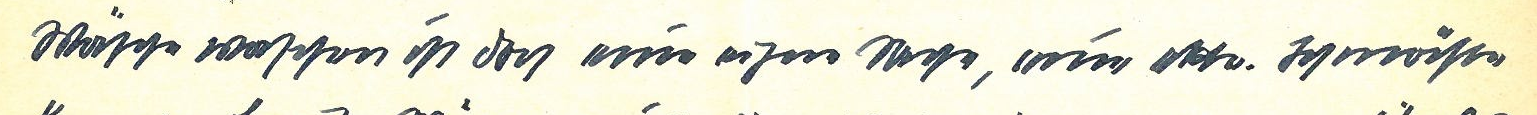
Wäsche waschen ist doch eine eigene Sache, eine ekle. Ich möchte
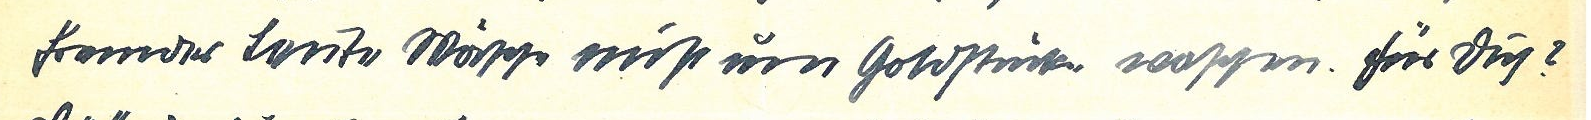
fremder Leute Wäsche nicht um Goldstücke waschen. Für Dich?
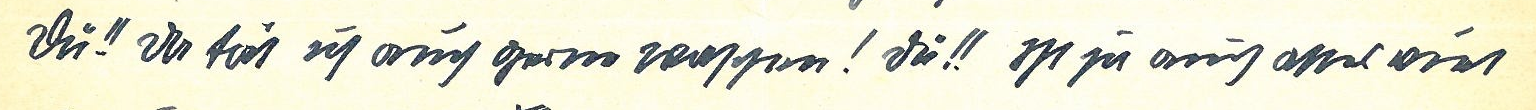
Du!! Da tät ich auch gerne waschen! Du!! Ist ja auch alles viel
